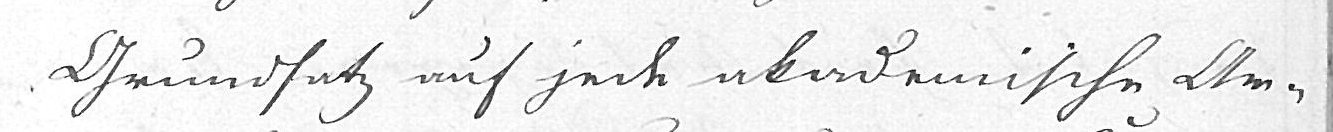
Grundsatz auf jeden akademische Ar-
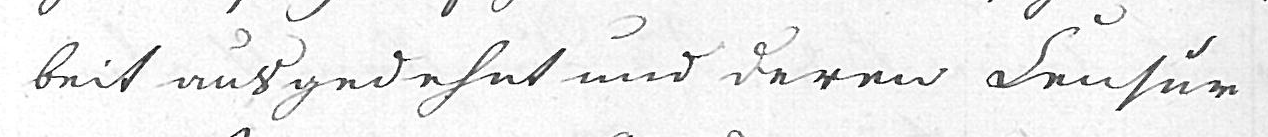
beit ausgedehnt und deren Censur
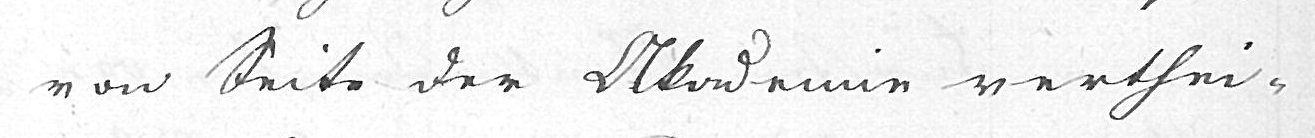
von Seite der Akademie verthei-
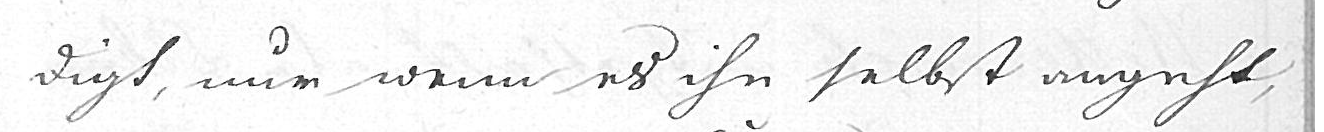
digt, nur wenn es ihn selbst angeht,
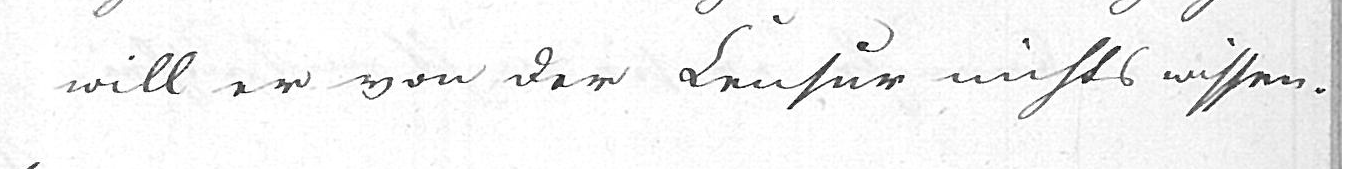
will er von der Censur nichts wissen.
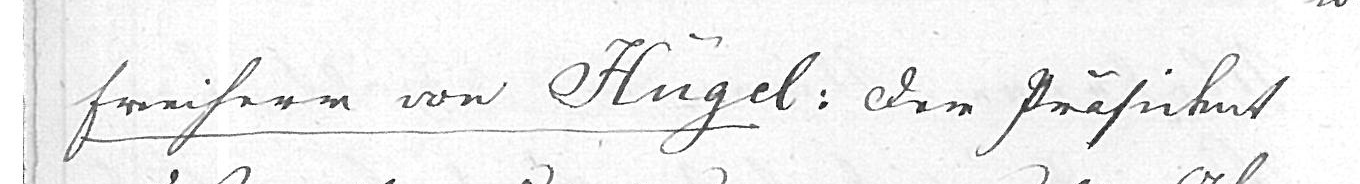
Freiherr von Hügel: Der Präsident
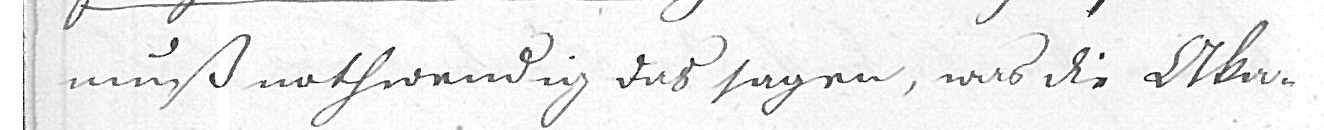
muß nothwendig das sagen, was die Aka-
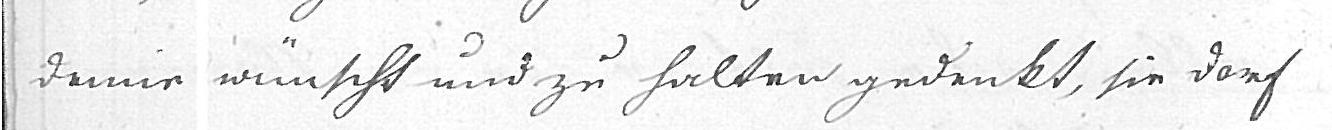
demie wünscht und zu halten gedenkt, sie darf
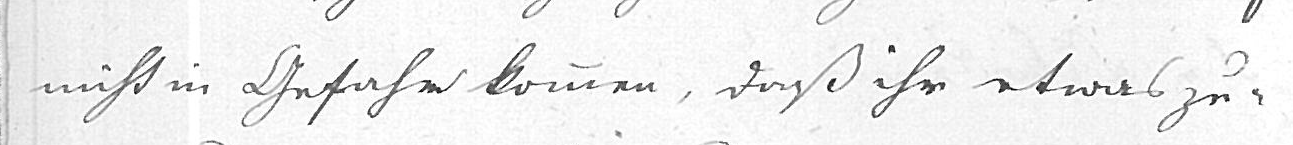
nicht in Gefahr kommen, daß ihr etwas zu-
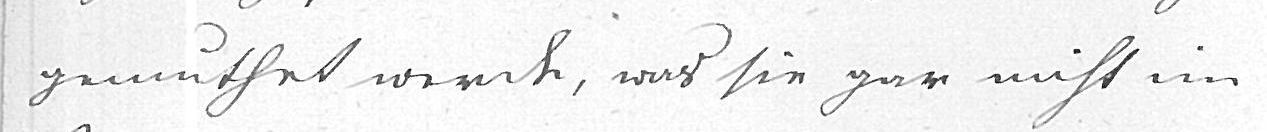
gemuthet werde, was sie gar nicht im
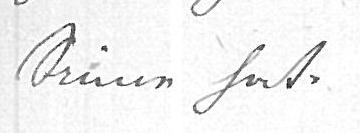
Sinne hat.
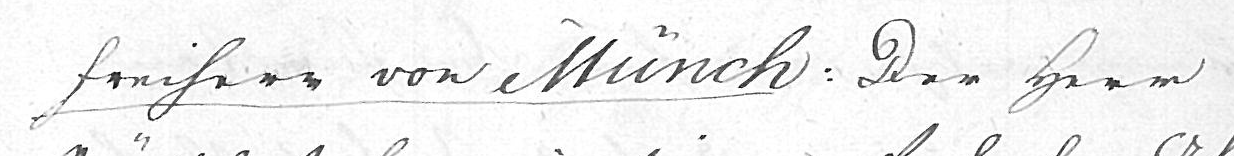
Freiherr von Münch: Der Herr
